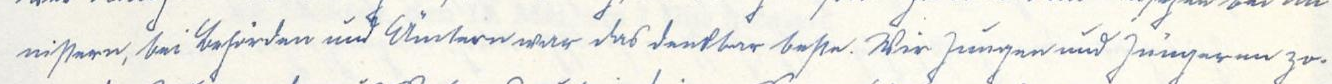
ninstern, bei Behörden und Ämtern war das denkbar beste. Wir Jungen und jüngeren zo-
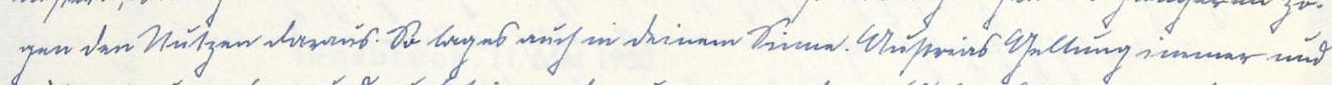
gen den Nutzen daraus. So lag es auch in deinem Sinne. Austrias Geltung immer und
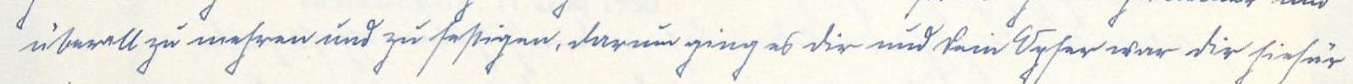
überall zu mehren und zu festigen, darum ging es dir und kein Opfer war dir hiefür
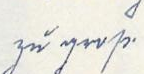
zu groß.
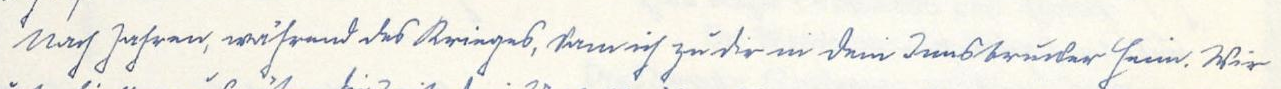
Nach Jahren, während des Krieges, kam ich zu dir in dem Innsbrucker Heim. Wir
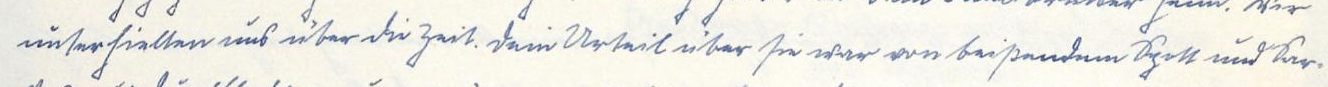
unterhielten uns über die Zeit, dein Urteil über sie war von beißenden Sport und Sar-
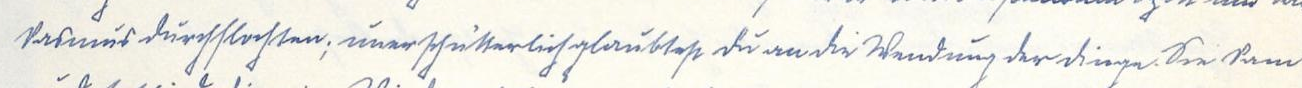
kasmus durchflossen; unerschütterlich glaubtest du an die Wandlung Wendung der Dinge. Sie kam
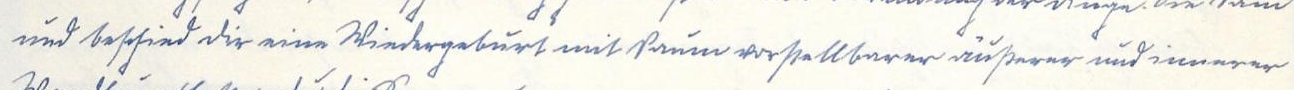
und beschied dir eine Wiedergeburt mit kaum vorstellbarer äußerer und innerer
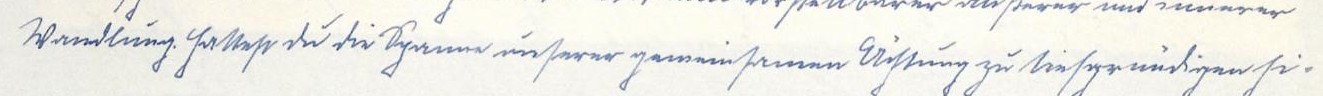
Wandlung. Hattest Du die Spanne unserer gemeinsamen Achtung zu tiefgründigen hi-
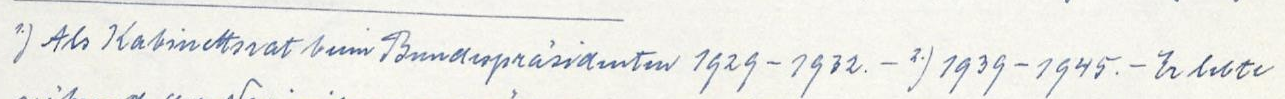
1) Als Kabinettsrat beim Bundespräsidenten 1929-1932.- 2) 1939-1945. Er lebte
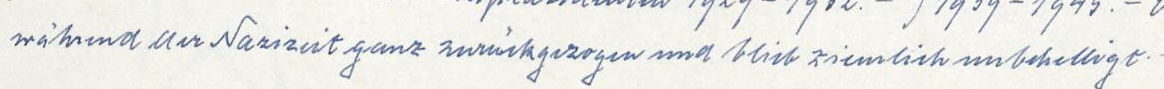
während der Nazizeit ganz zurückgezogen und blieb ziemlich unbehelligt.
